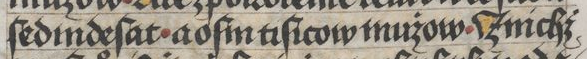ſedmdeſat.oſm tiſicow mużow.Znichż
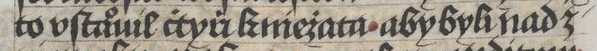to uſtaovil ċtyṙi knieżata.aby byli nad z¬
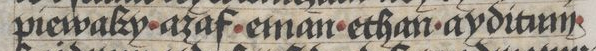piewaky.azaf.eman.ethan.a yditum.
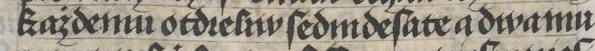każdemu otdieliw ſedmdeſate a dwa mu¬
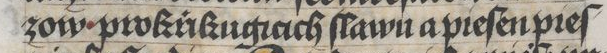zow.prokṙikugicich ſlawu a pieſen pieſ¬
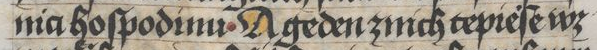nia hoſpodinu.A geden znich tepieẛe wz¬
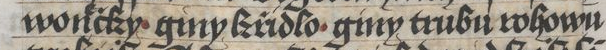wonečky. giny kṙídlo.giny trubu rohowu
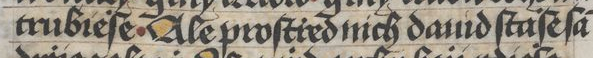trubieẛe.Ale proſtṙed nich david ſtaſe ſa¬
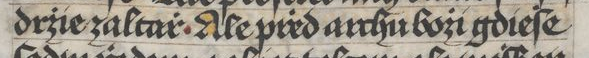držíe zaltaṙ.Ale pṙed archu boží gdíeẛe
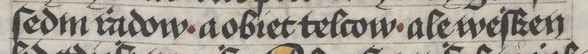ſedm ṙadow.a obiet telcow.ale weẛken
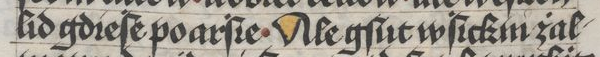lid gdieẛe po arẛíe.Ale gſut wẛickni żal¬
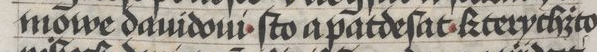mowe davidovi.ſto a patdeſat.kterychžto
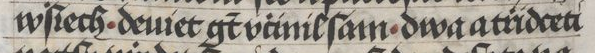wẛiech.devíet ḡt uċinil ſám.dwa a tṙidceti
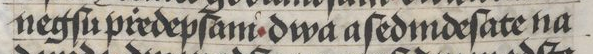negſu pṙedepſani.dwa a ſedmdeſate na
